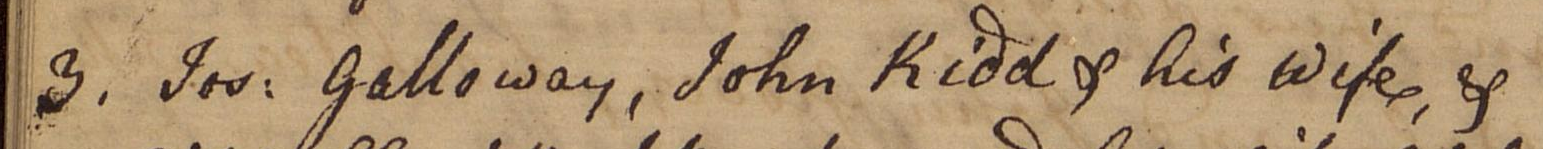3. Jos: Galloway, John Kidd & his wife, &
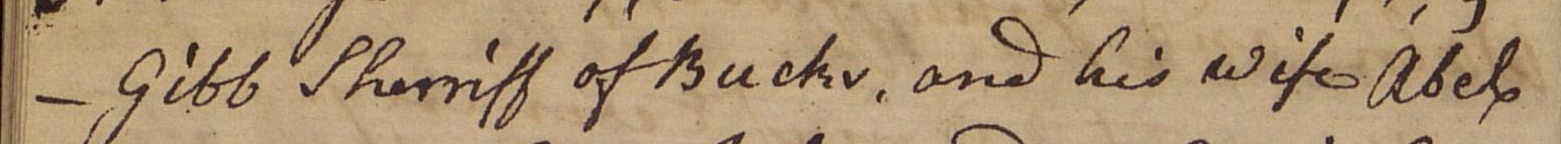-Gibb Sherriff of Bucks, and his wife Abel
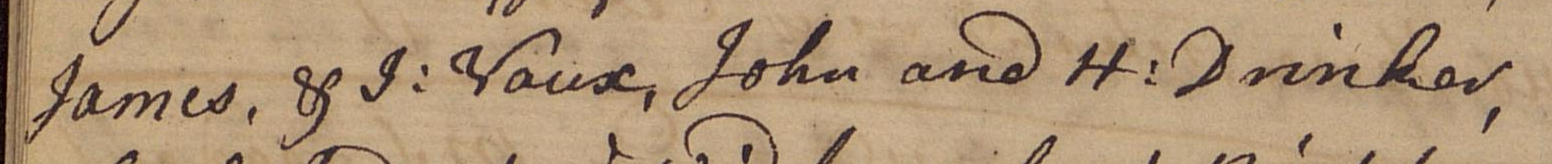James, & J:Vaux, John and H: Drinker,
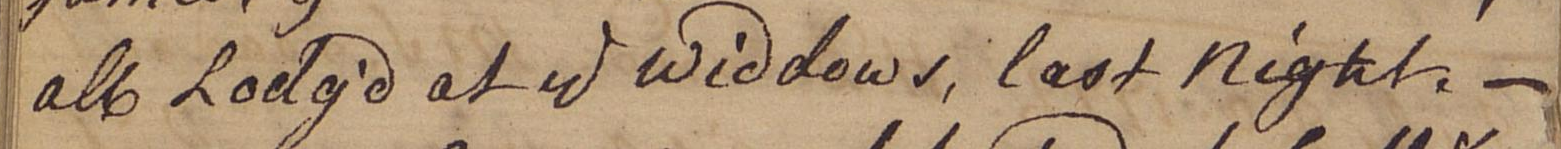all Lodg'd at y^e Widdows, last night.-
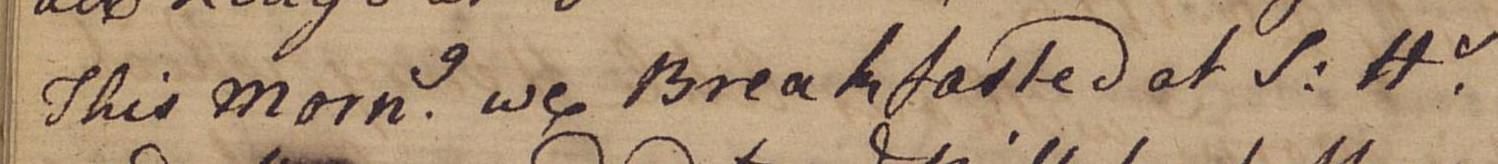This morn^g. we Breakfasted at S: H^c.
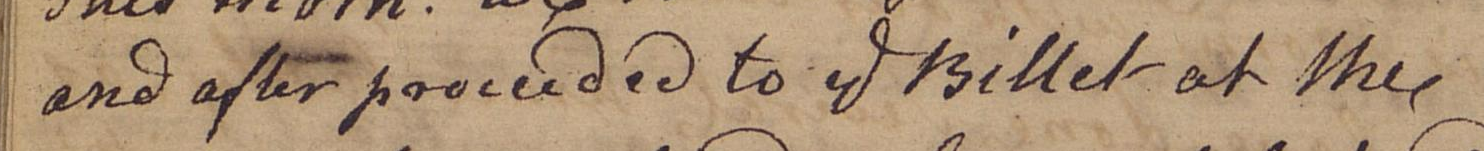and after proceeded to y^e Billet at the
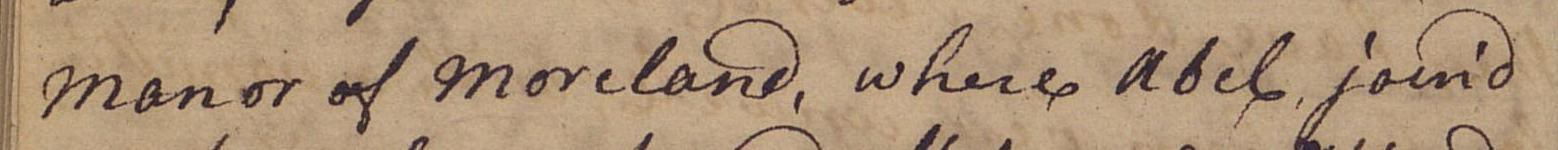Manor of Moreland, where Abel join'd
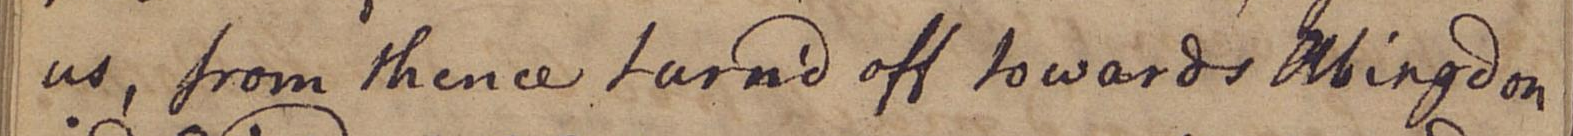us, from thence turn'd off towards Abingdon
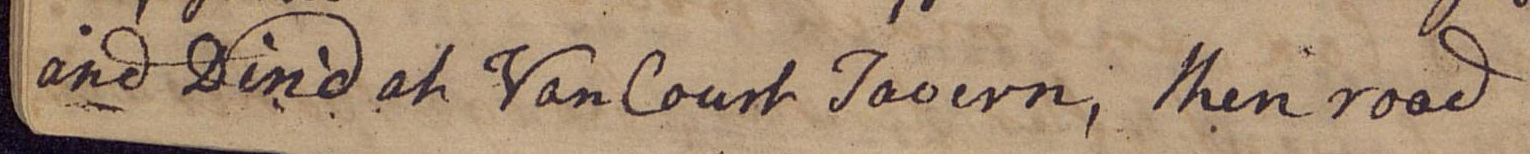and Din'd at Van Court Tavern, then road
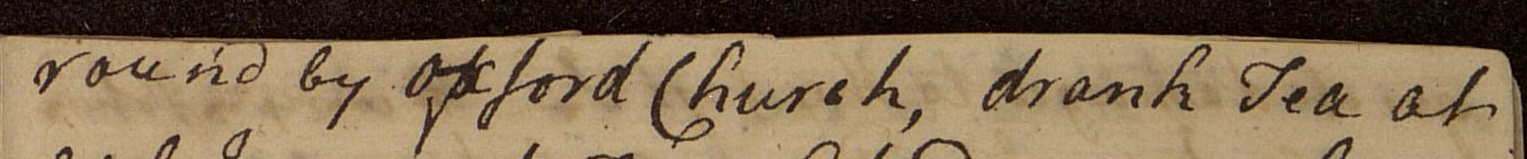round by Oxford Church, drank Tea at
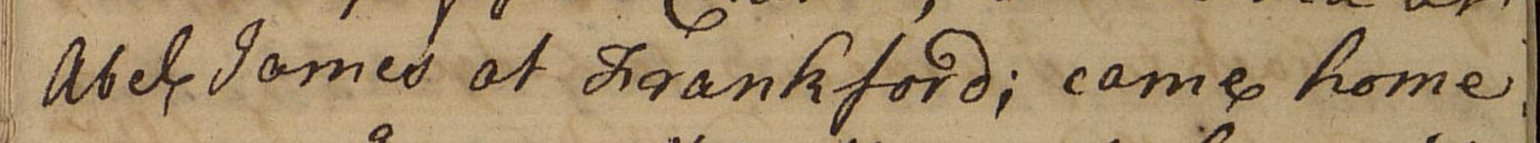Abel James at Frankford; came home
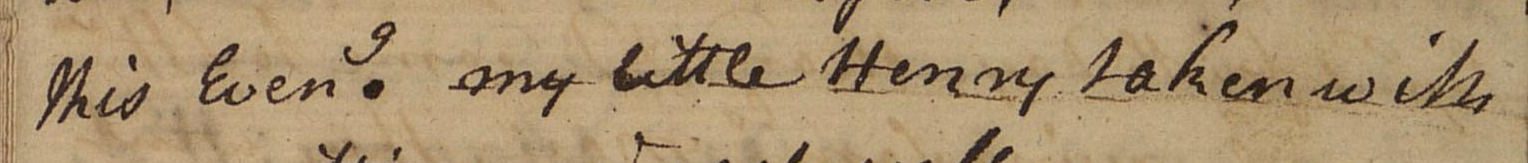this Even'g. my little Henry taken with
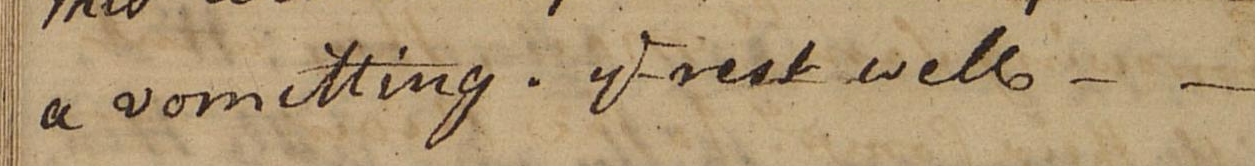a vomitting. y^e rest well-
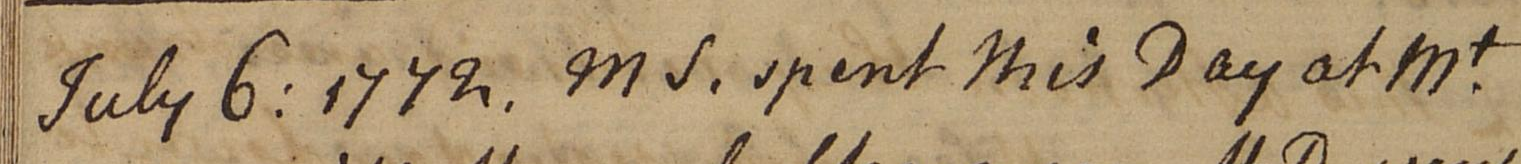July 6: 1772. MS. spent this Day at M^t.
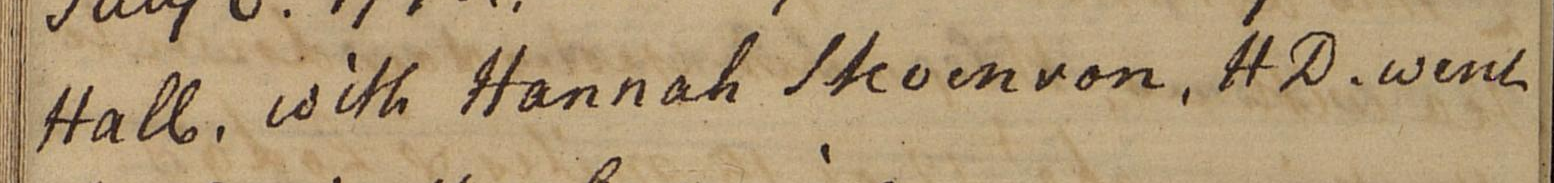Hall, with Hannah Stevenson, H D. went
